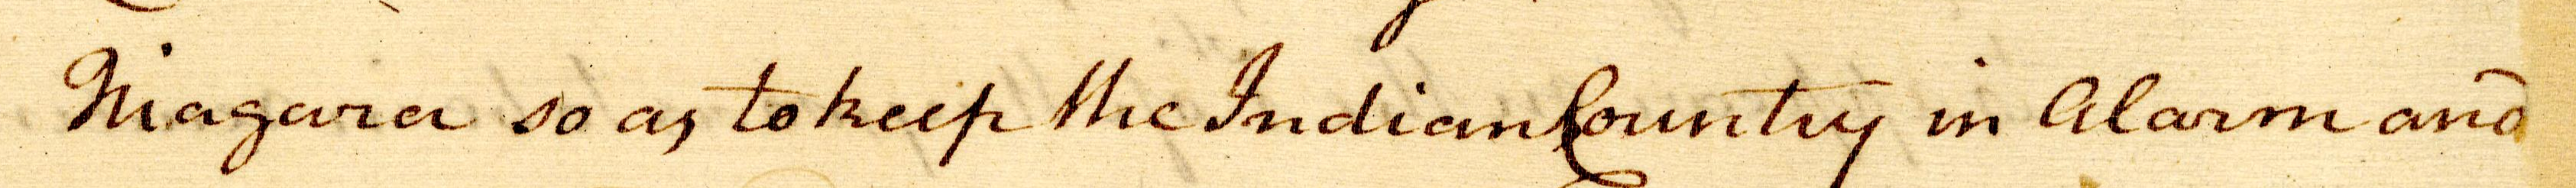Niagara so as to keep the Indian Country in Alarm and
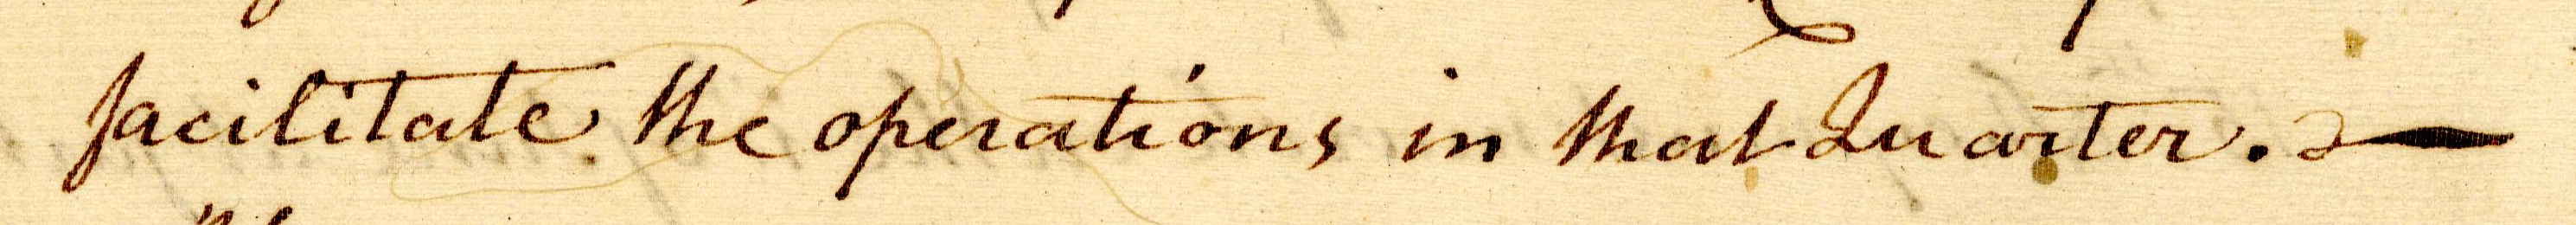facilitate the operations in that Quarter.-
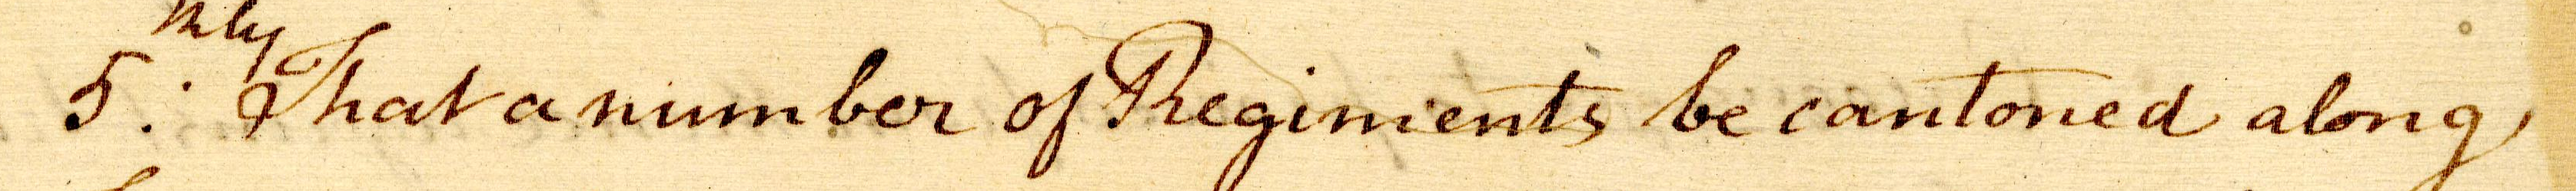5^thly: That a number of Regiments be cantoned along
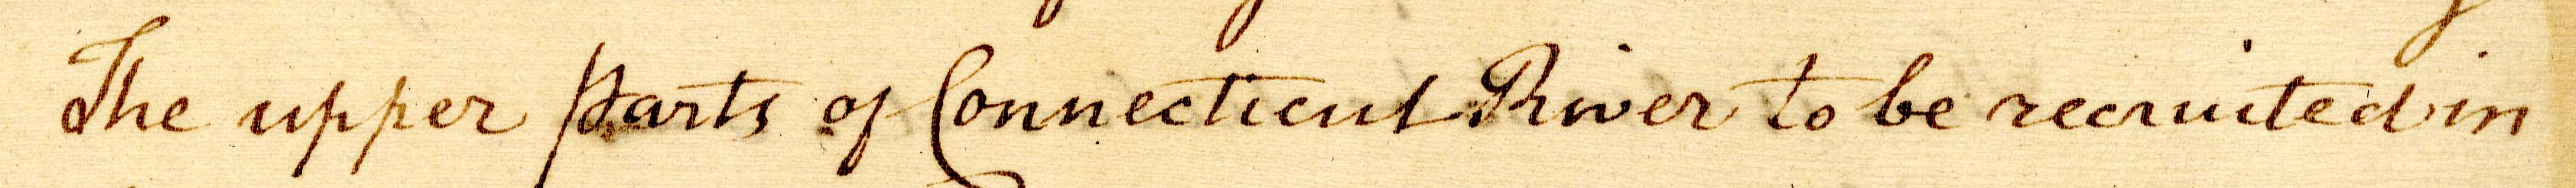the upper Parts of Connecticut River to be recruited in
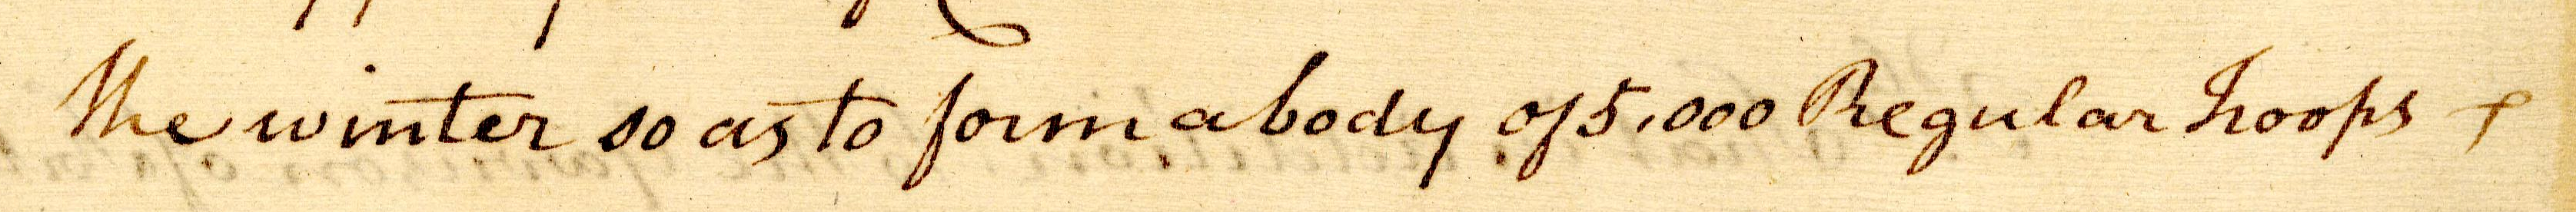the winter so as to form a body of 5,000 Regular Troops &
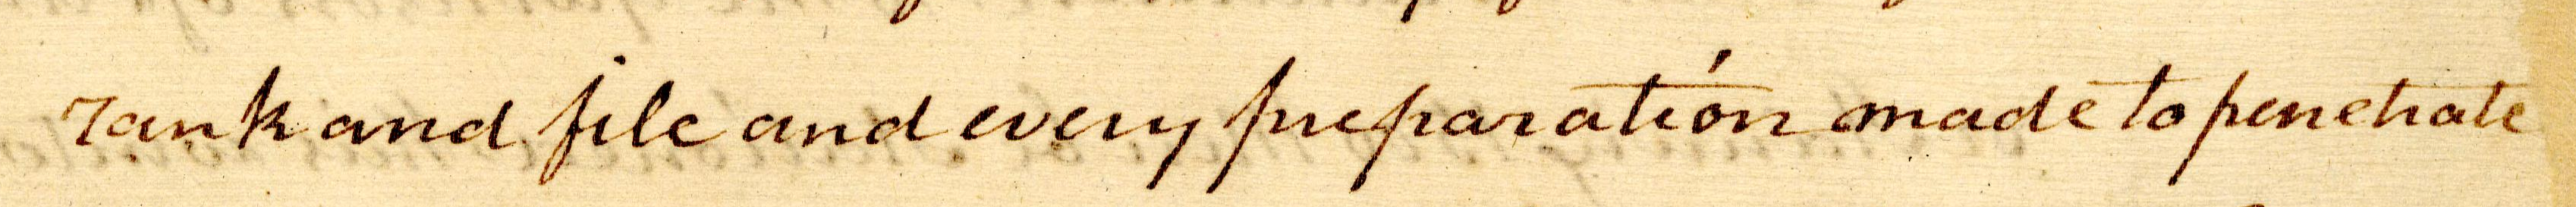rank and file and every preparation made to penetrate
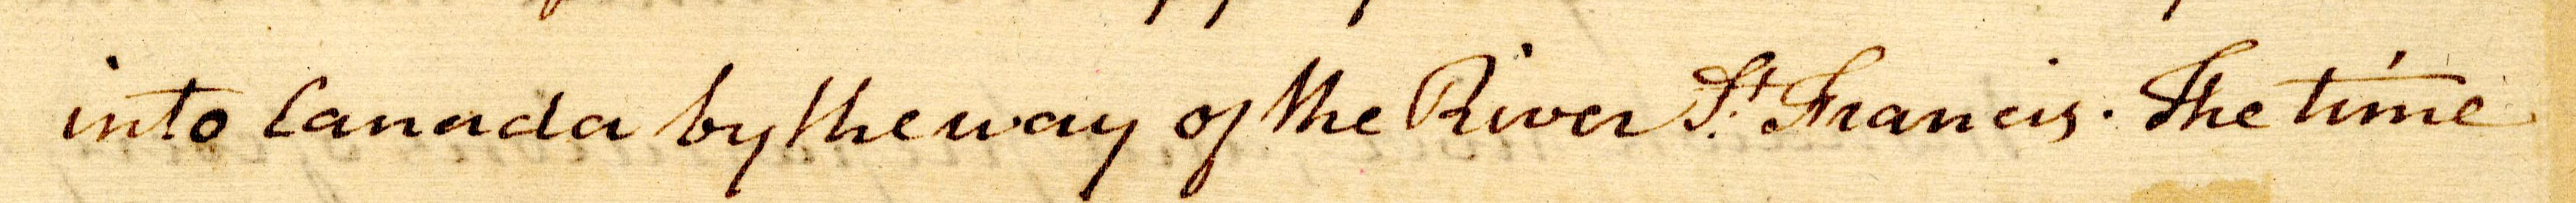into Cannda by the way of the River S^t: Francis. The time
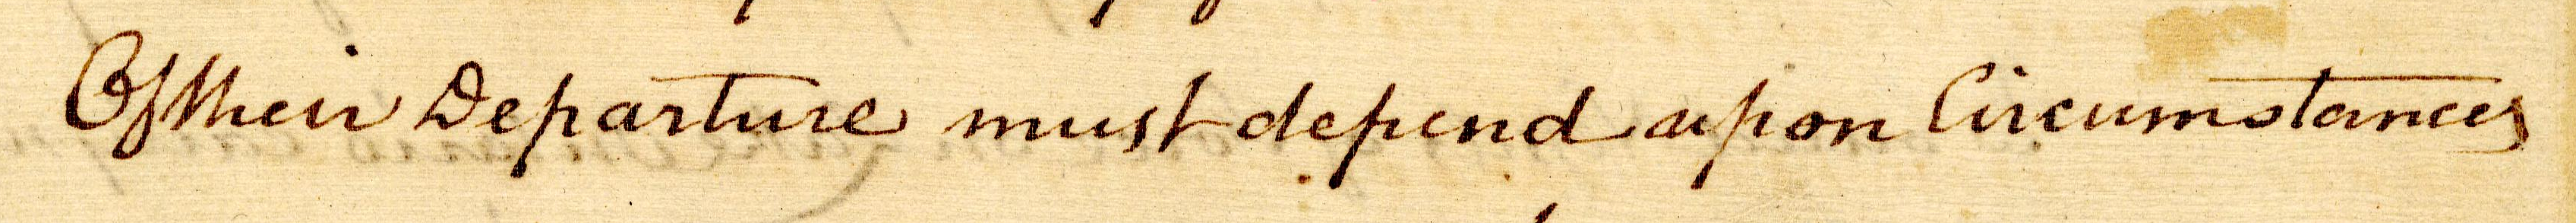Of their Departure must depend upon Circumstances
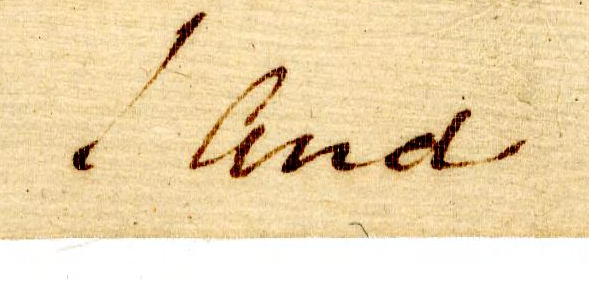And
